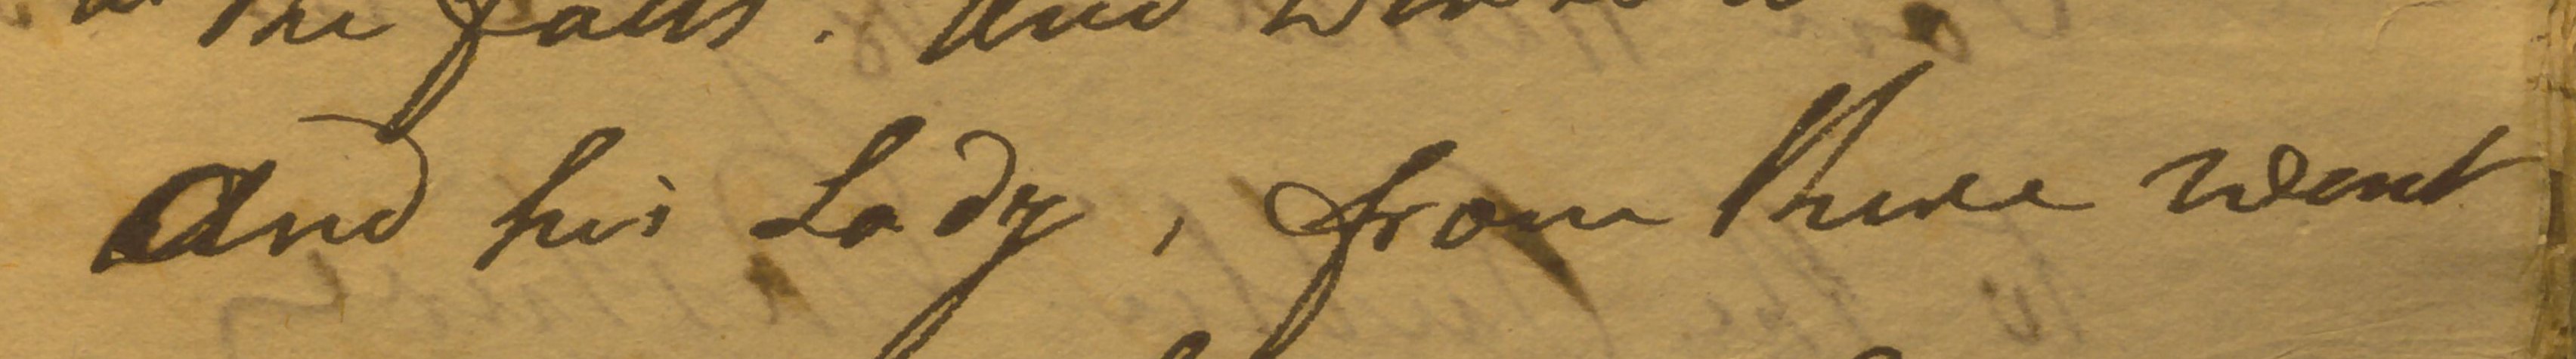and his Lady, from there went
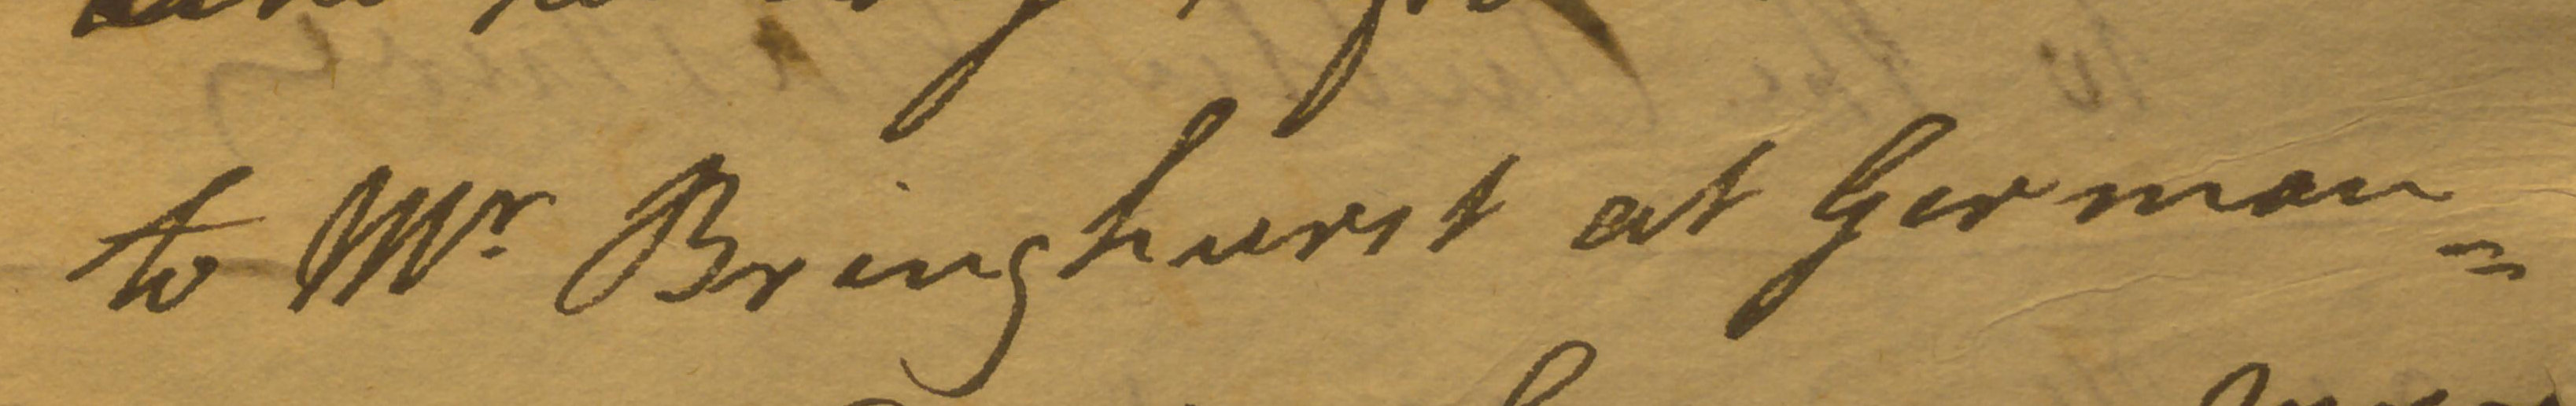to M^r. Bringhurst at German
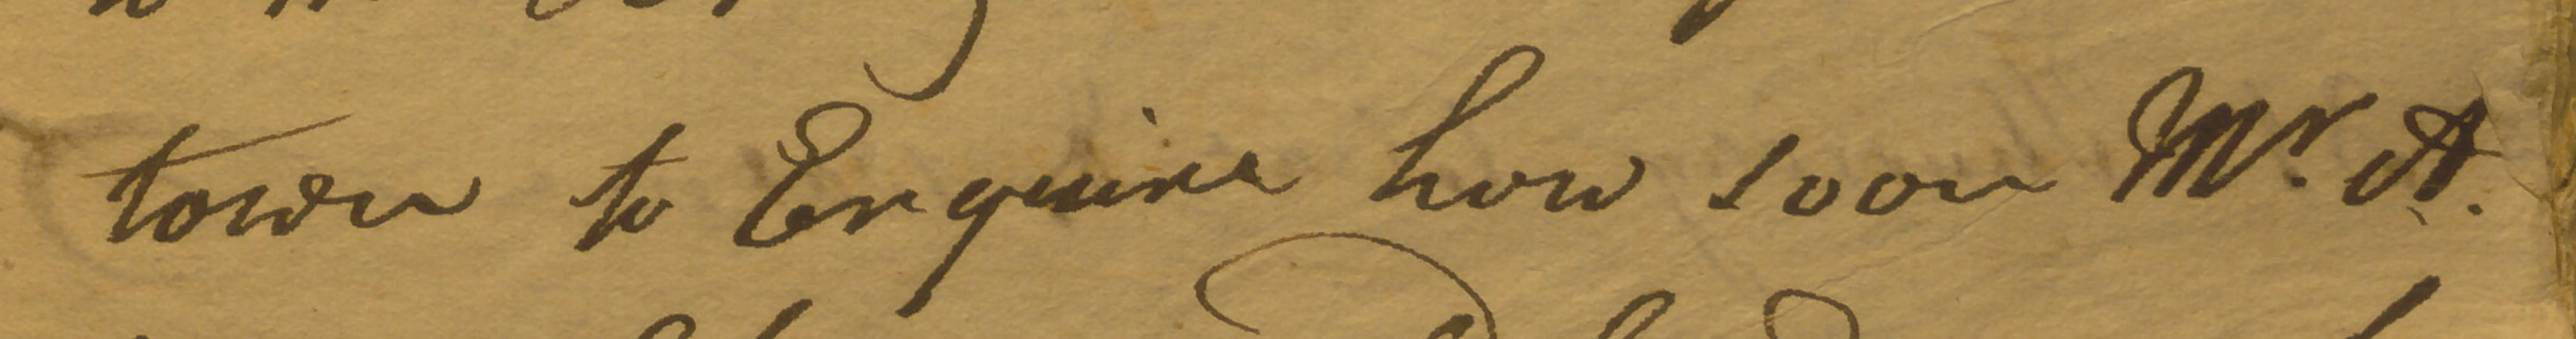town to Enquire how soon M^r. A
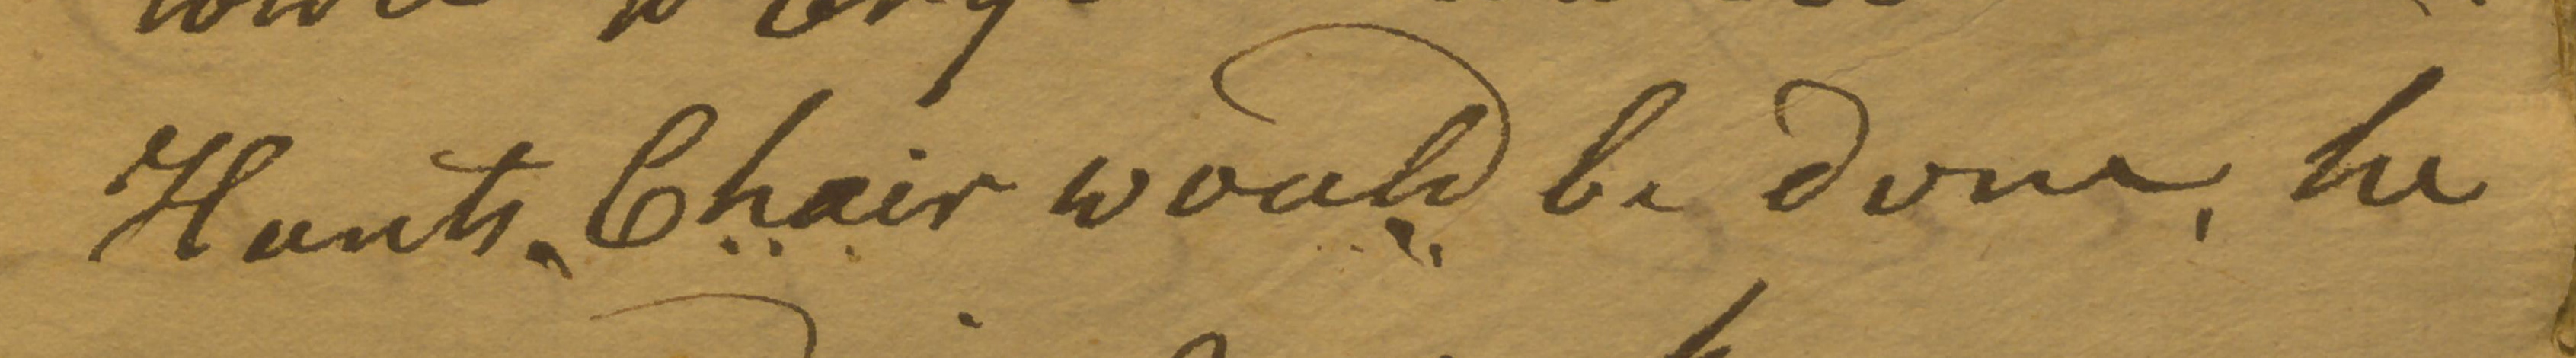Hunts Chair would be done he
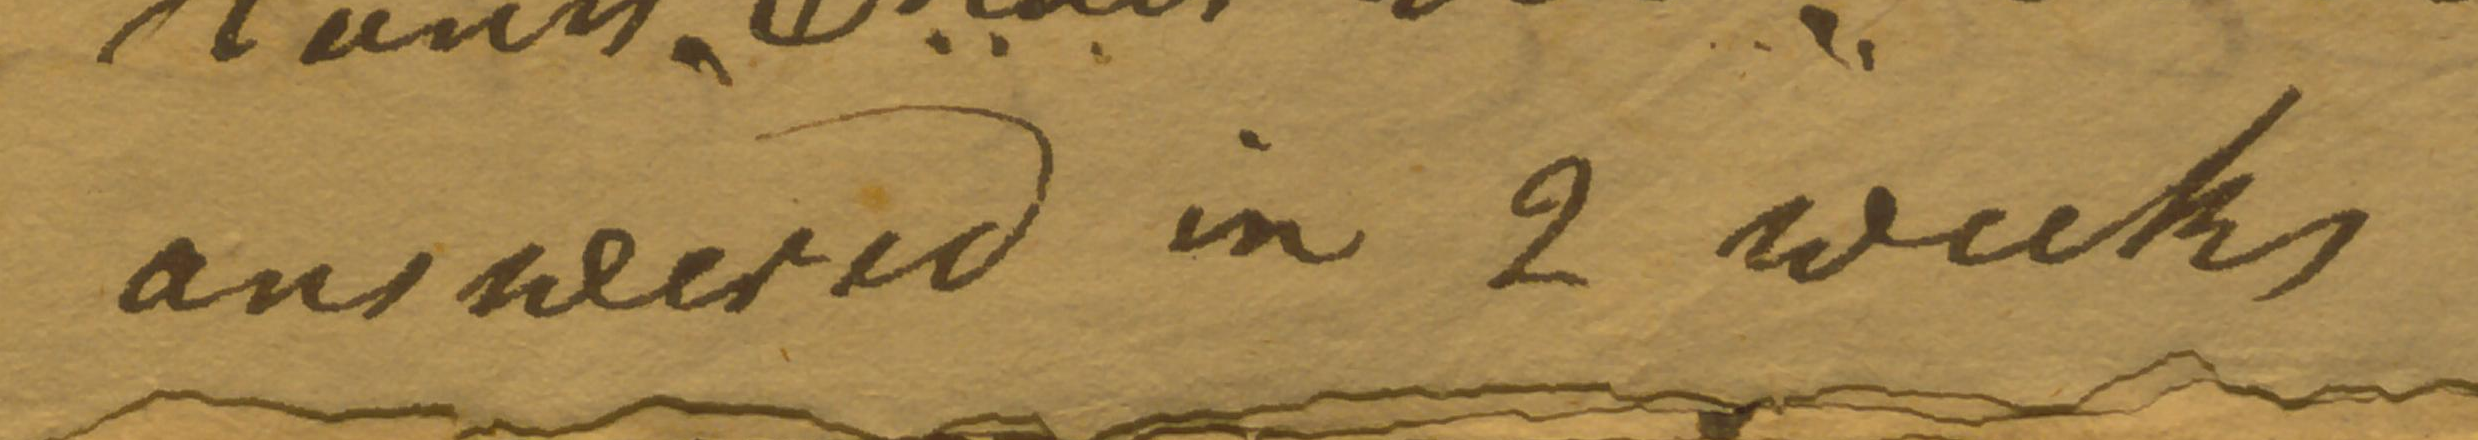answered in 2 week
